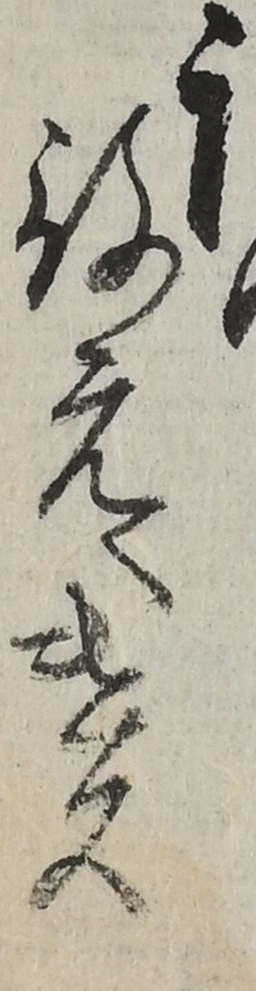役元へ遣ス
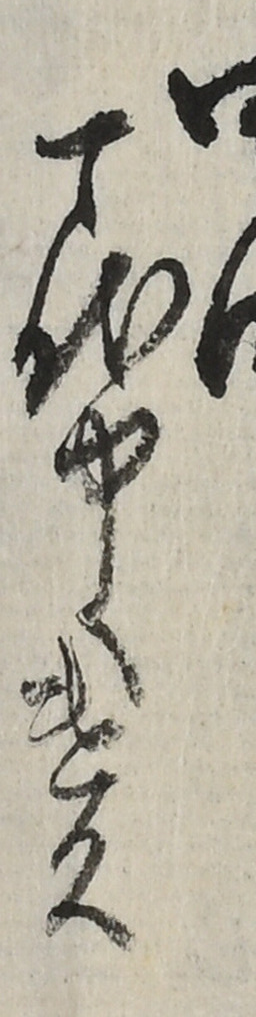丁代中へ遣ス
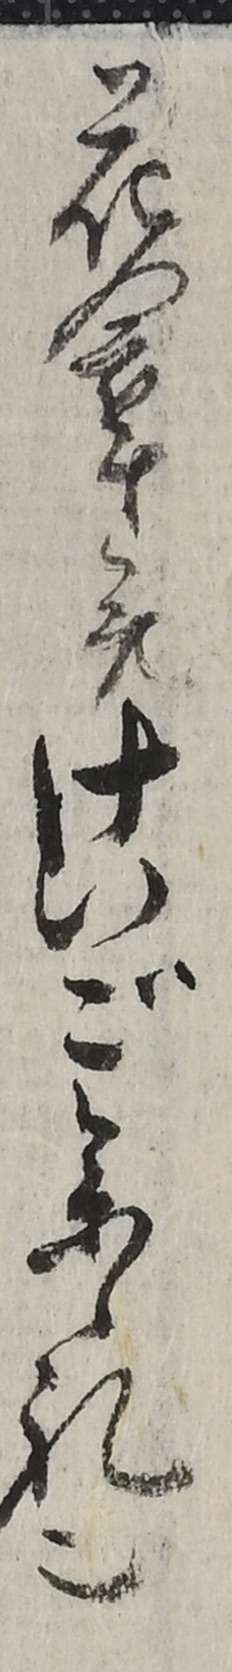花傘并けいご参候礼也
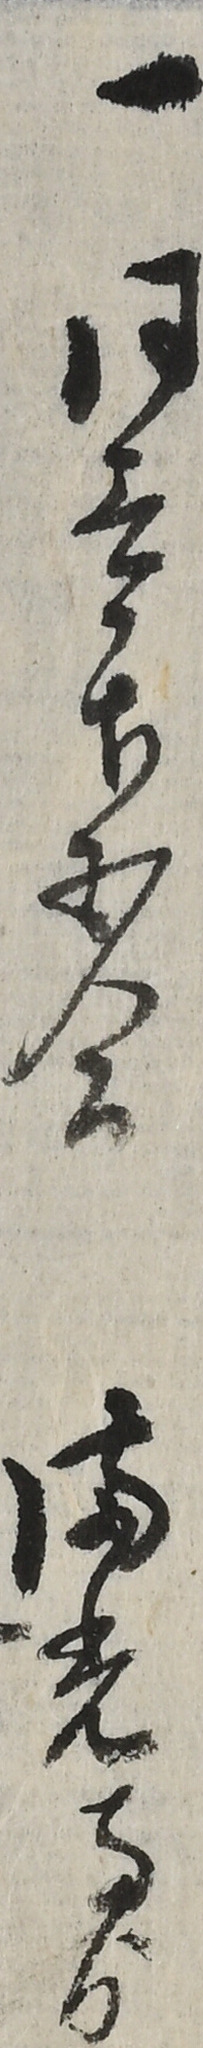一同壱升五合満光寺ゟ
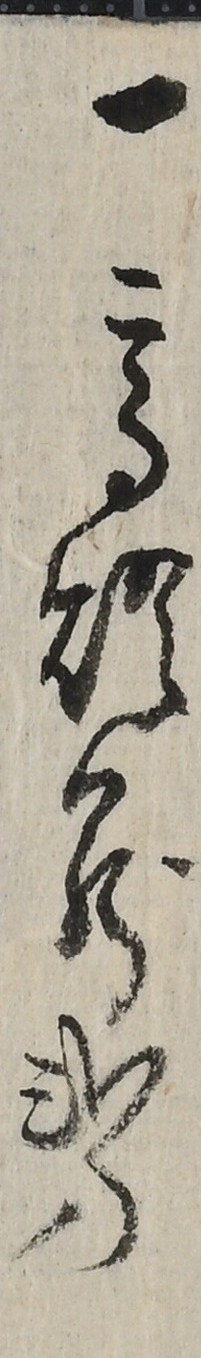一高灯籠地方
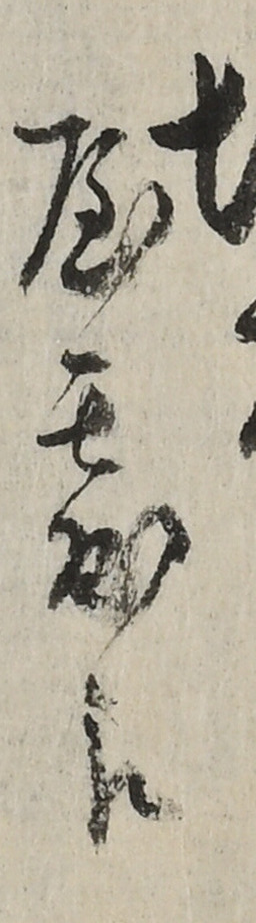屋敷江
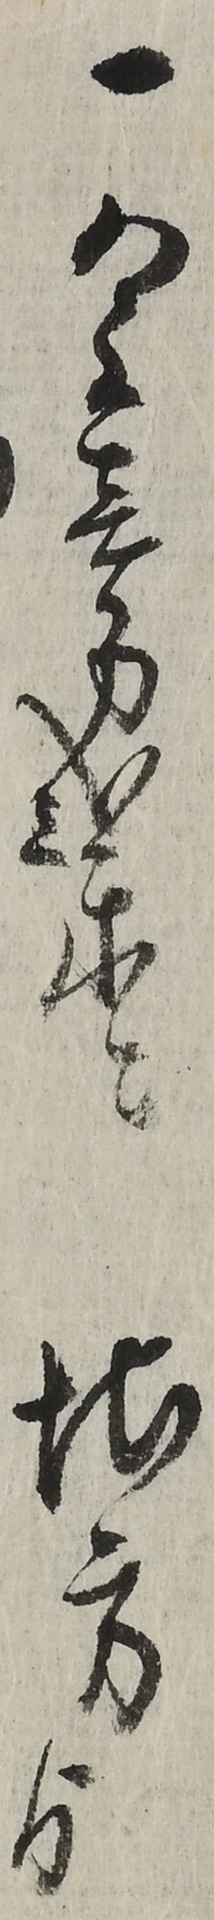一金壱分弐朱ニ地方ゟ
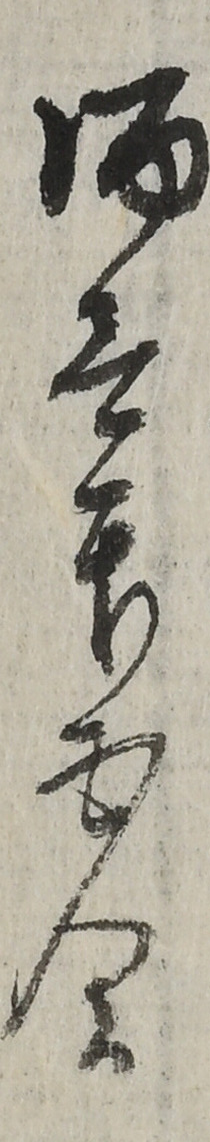酒壱升五合
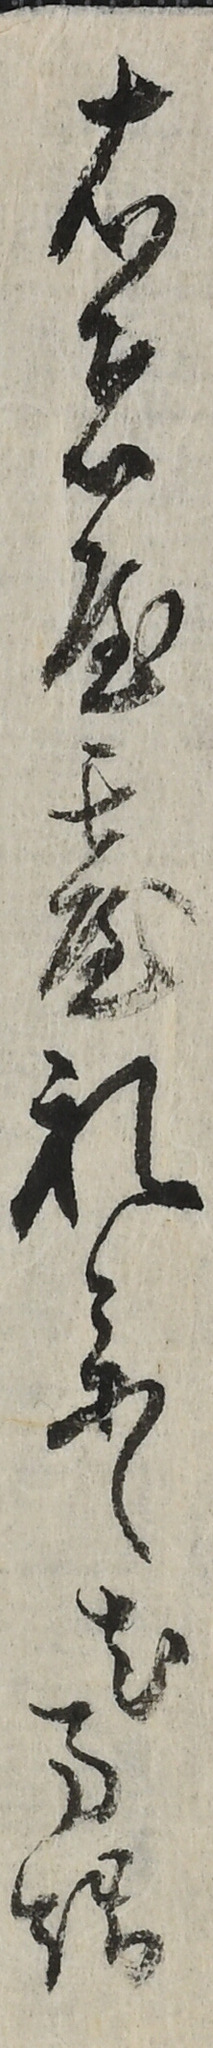右者屋台礼参候尤万端
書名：覚書
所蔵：伊那市立高遠町図書館・合同会社AMANE
